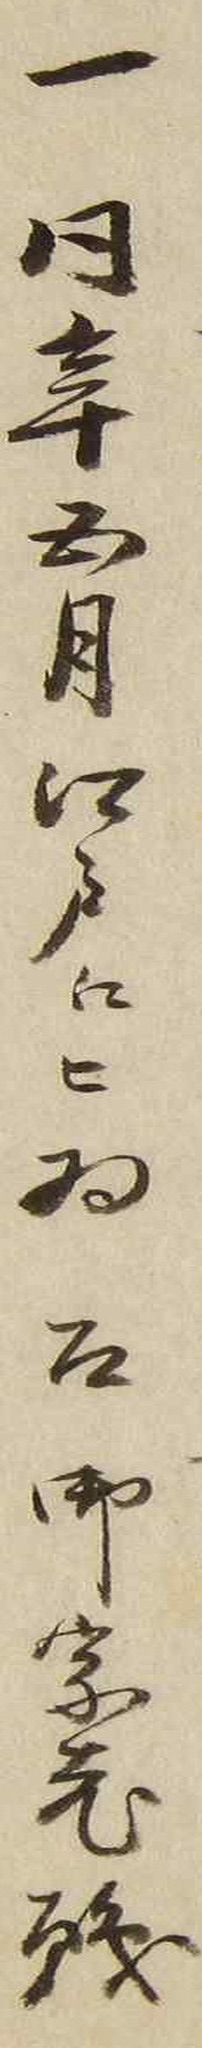一同年五月江戸江被為召御家老職

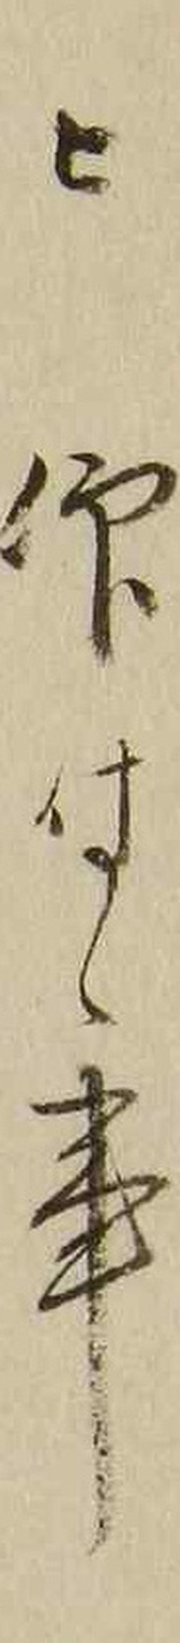被仰付候事
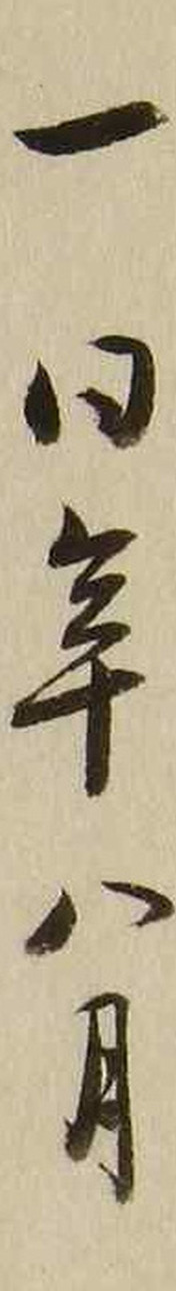一同年八月
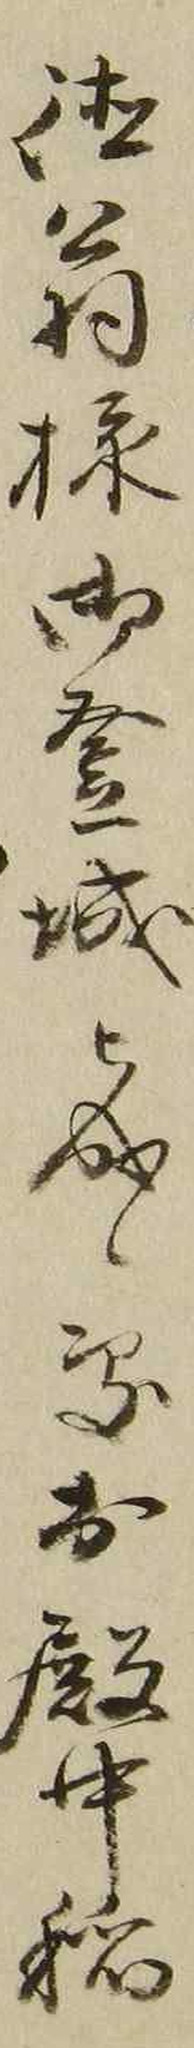徳翁様御登城被成候処於殿中稻
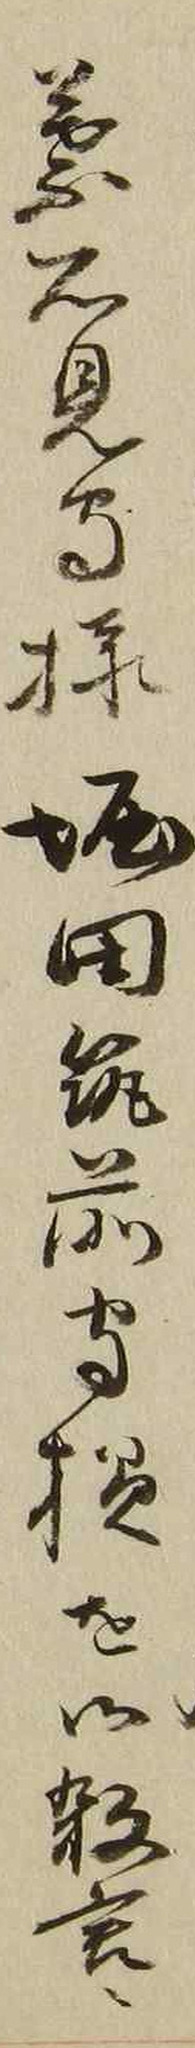葉石見守様堀田筑前守様を御殺害に
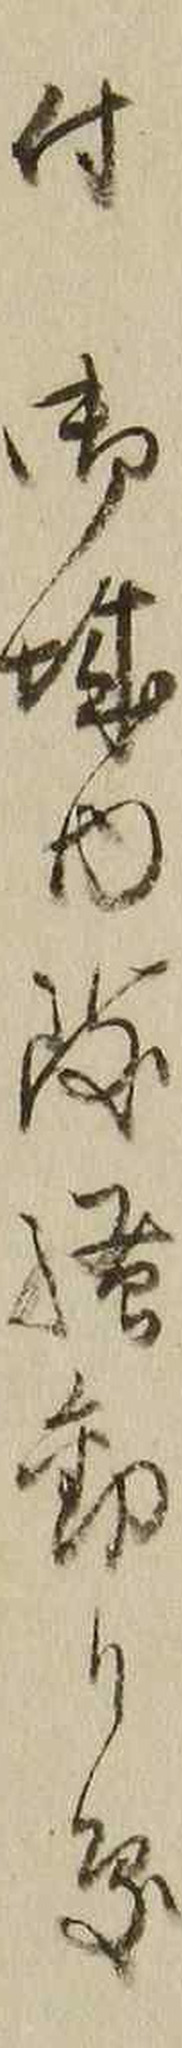付御城内致騒動候処
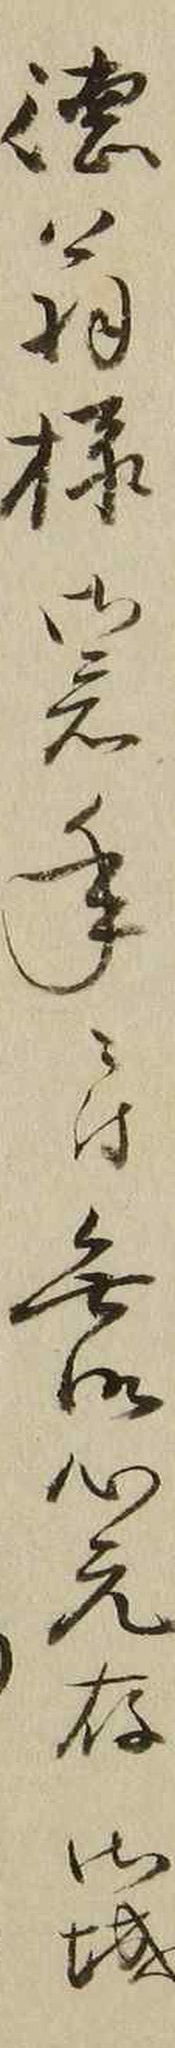徳翁様御若年に付無御心元存御城
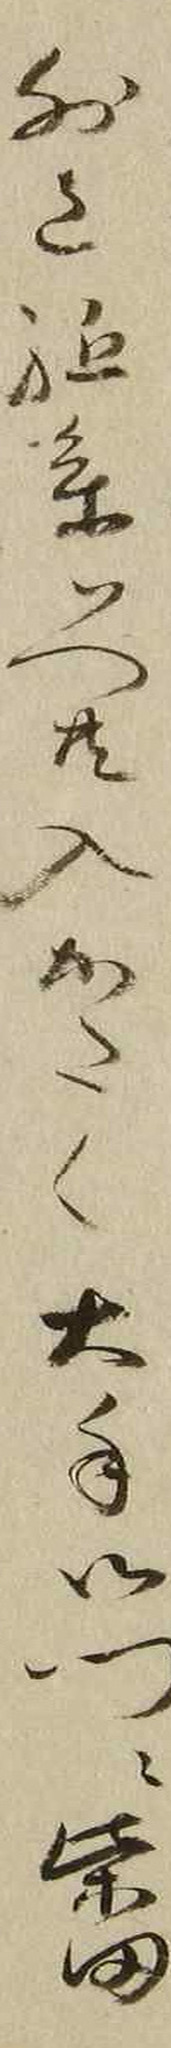前迄駆参候へ共入かたく大手御門に柴田
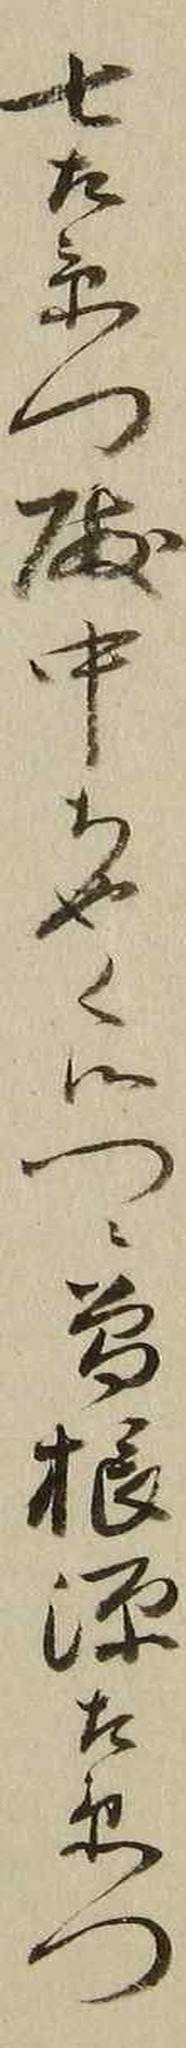七左衛門殿中ちやく御門に曽根源左衛門
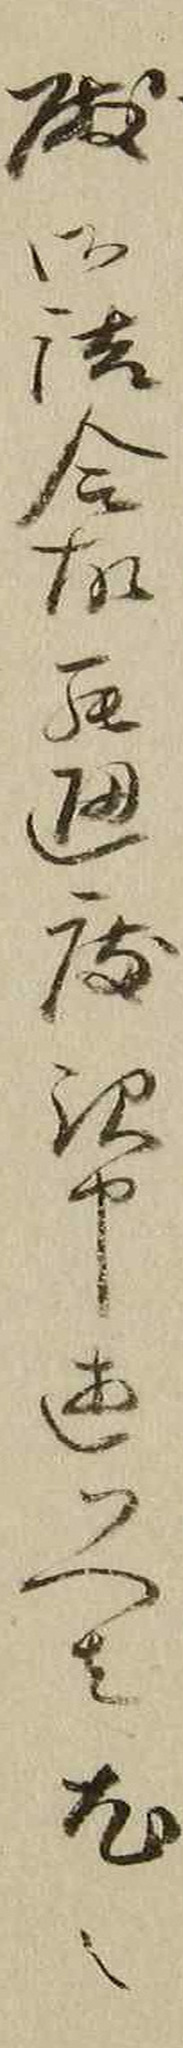殿御詰合故罷通度訳申遊候へは尤之
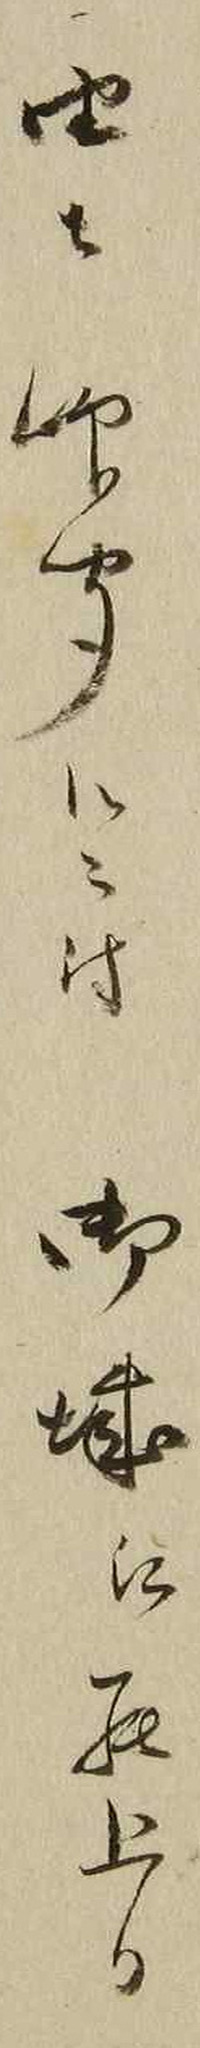由被仰聞候に付御城へ罷上り
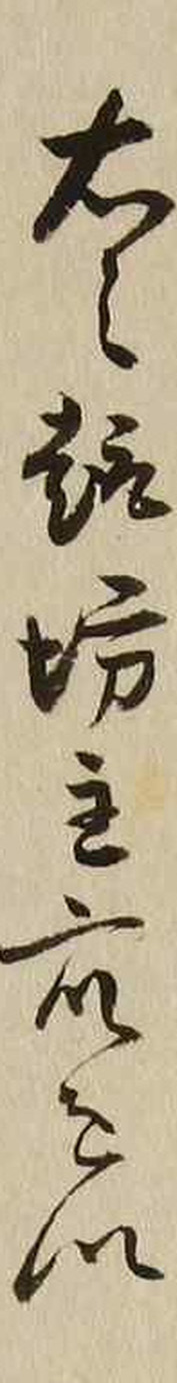右之趣坊主衆を以
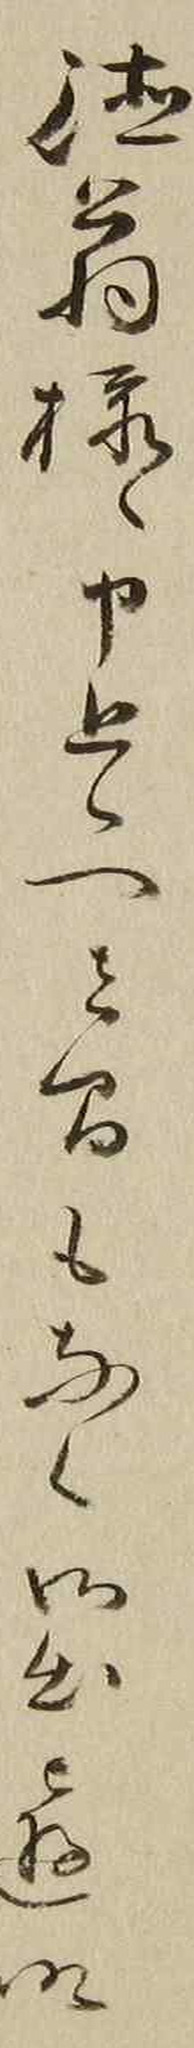徳翁様へ申上候へは間もなく御出被遊御
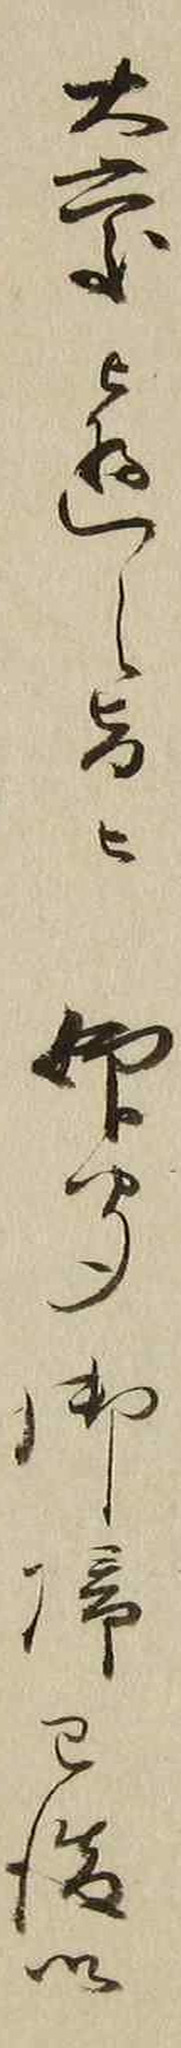大慶被遊候旨被仰聞御帰已後御
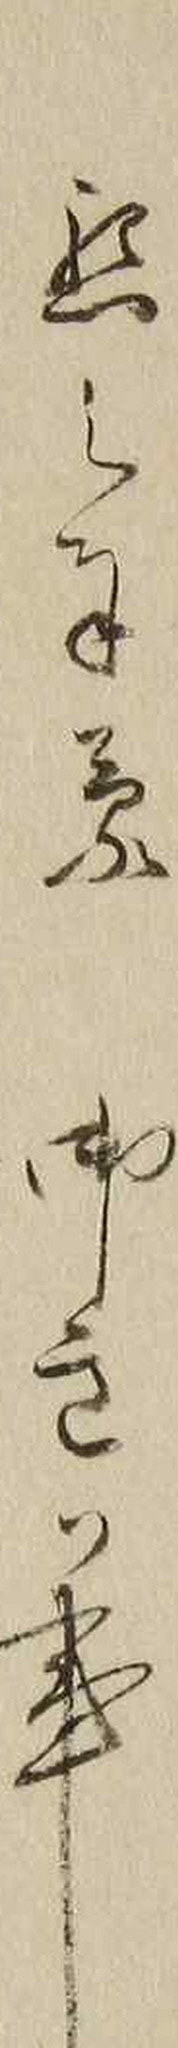懇之奉蒙御意候事
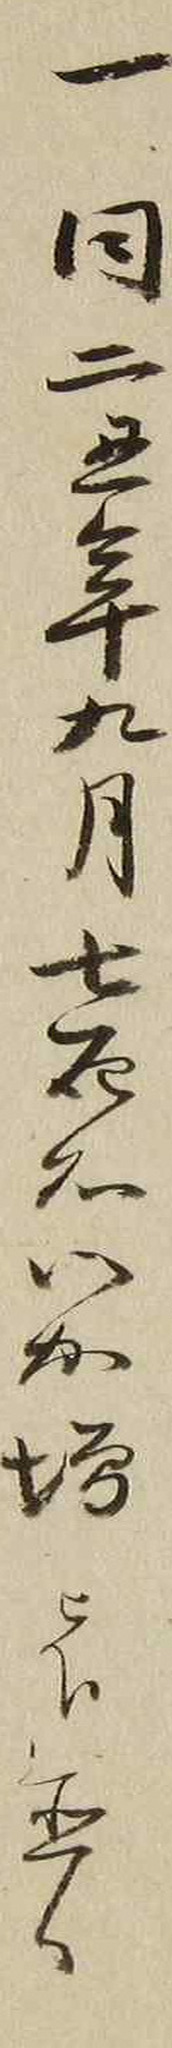一同二丑年九月七百石御加増被下置候
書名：諸士系譜　巻之269　さ之部1
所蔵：会津若松市立会津図書館
